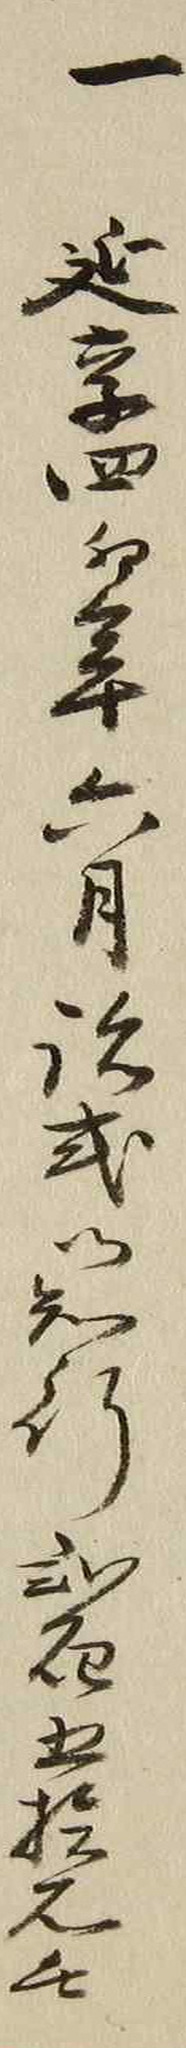一延享四卯年六月跡式御知行弐百五拾石無
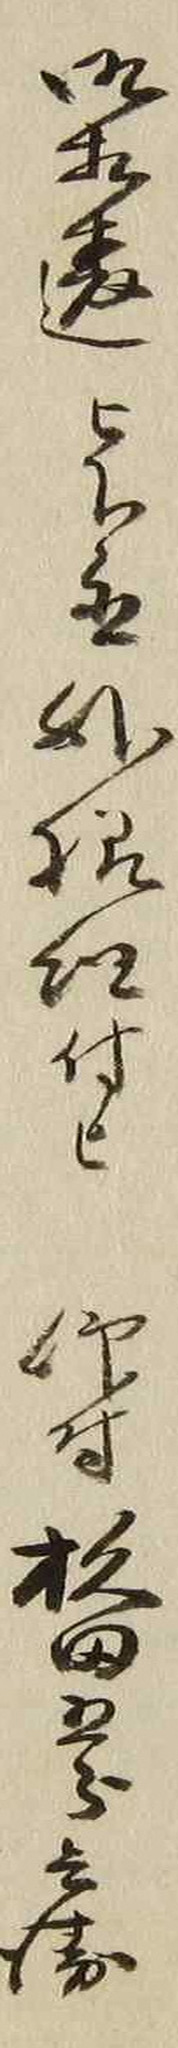御相違被下置外様組付被仰付杉田五郎兵衛
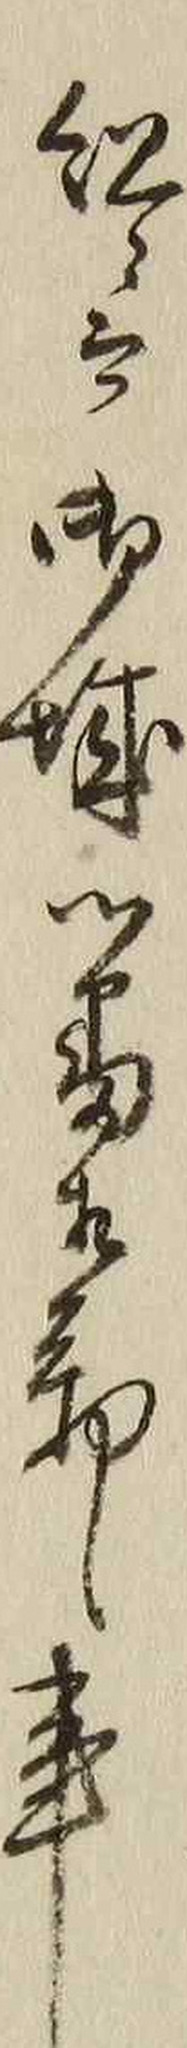組ニ而御城御番相勤候事
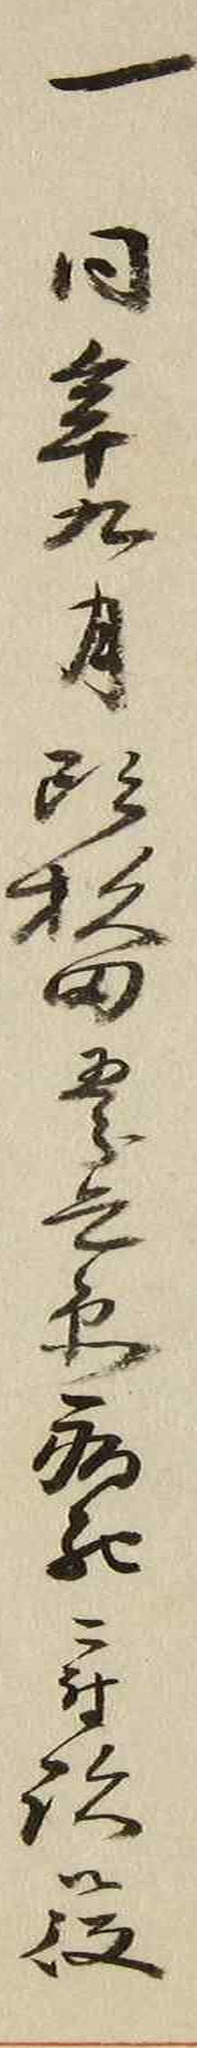一同年九月頭杉田五郎兵衛病死ニ付跡御役
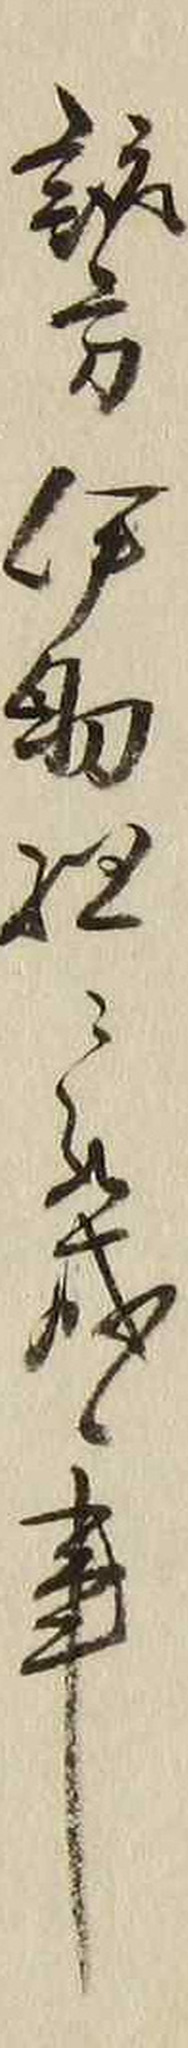諏方伊助組ニ罷成候事
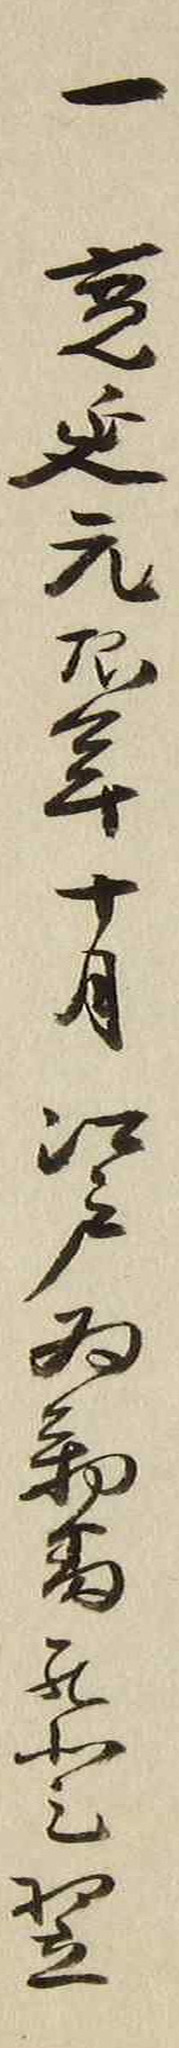一寛延元辰年十月江戸為勤番罷登翌
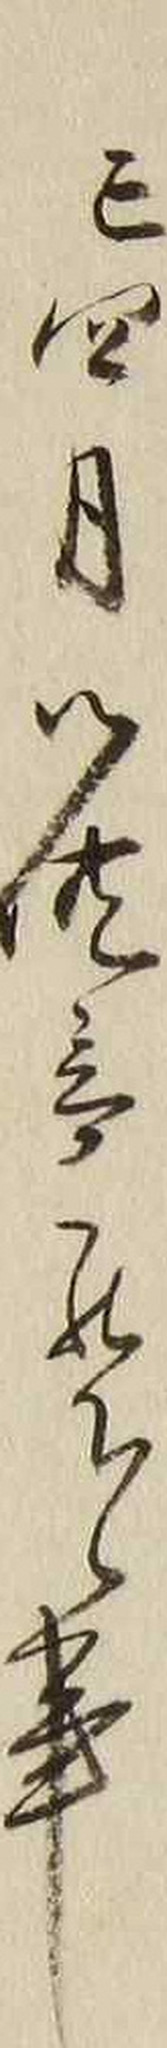巳四月御供ニ而罷下候事
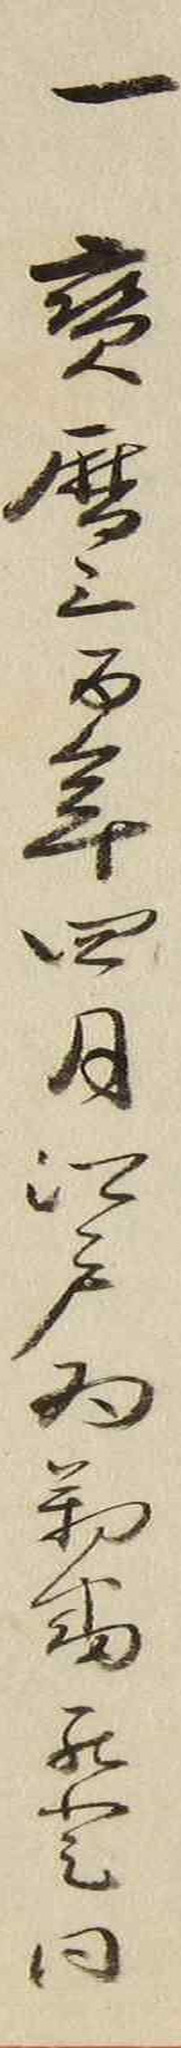一宝暦三酉年四月江戸為勤番罷登同
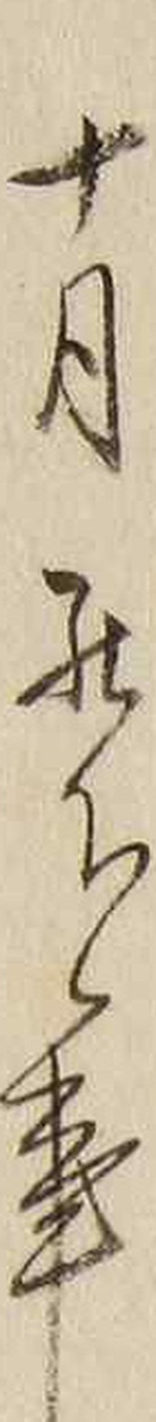十月罷下候事
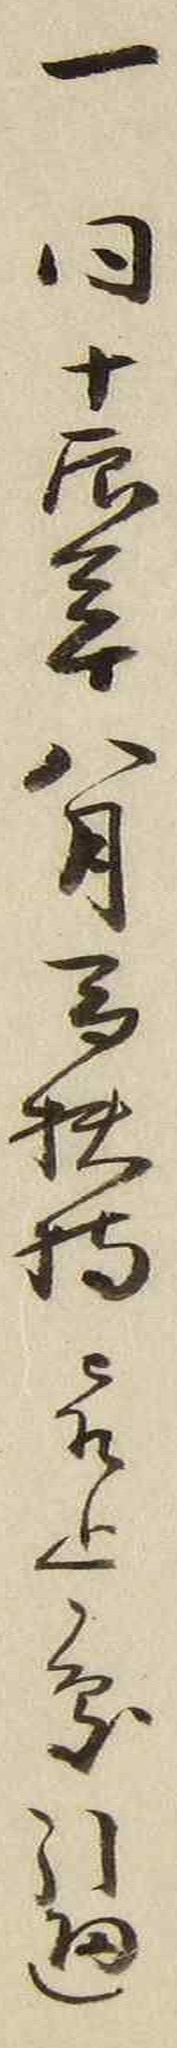一同十辰年八月馬扶持被相止候処引通

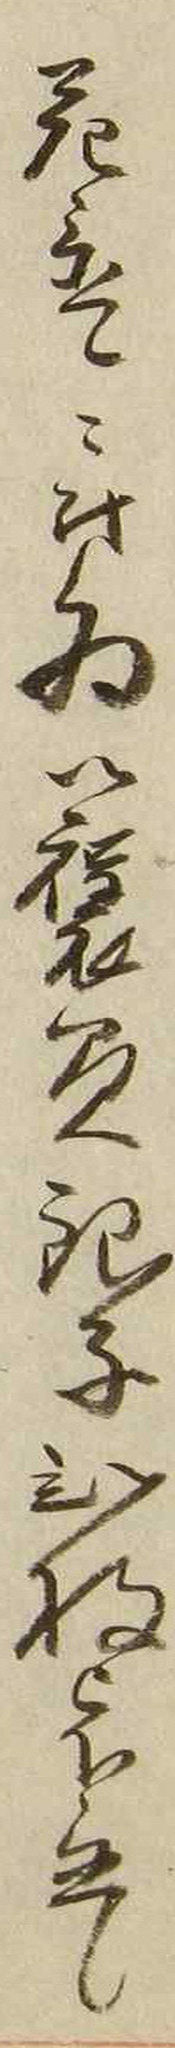差置候ニ付為御褒美銀子弐枚被下置候
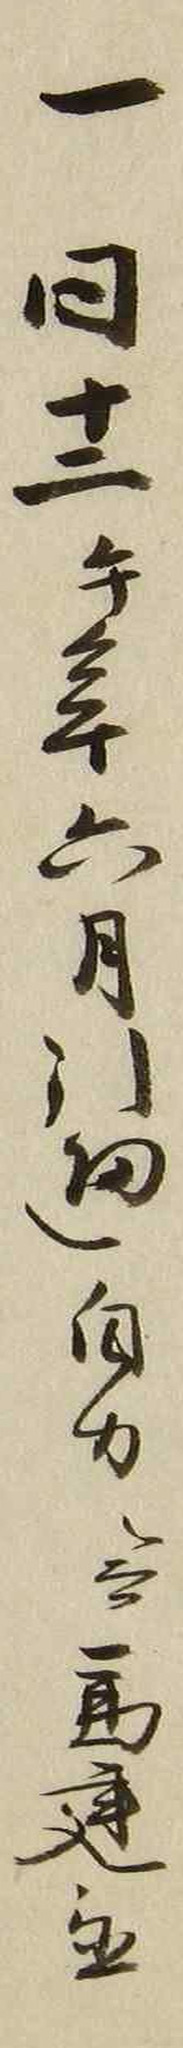一同十二午年六月引通自力ニ而馬建置
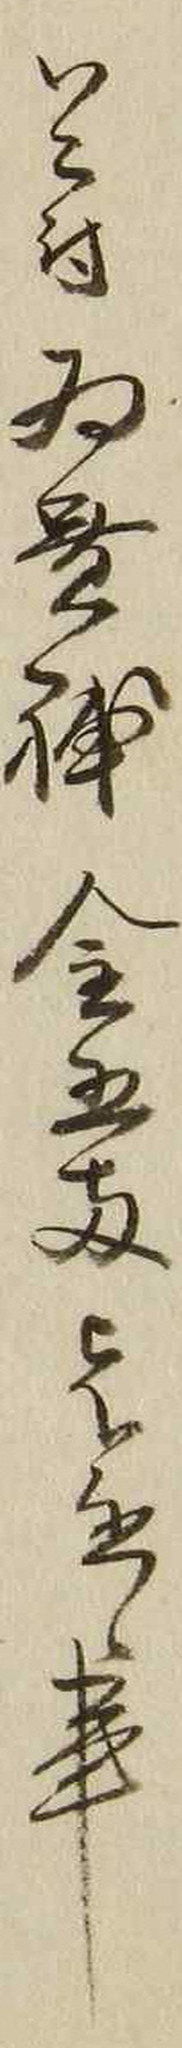候ニ付為費補金五両被下置候事
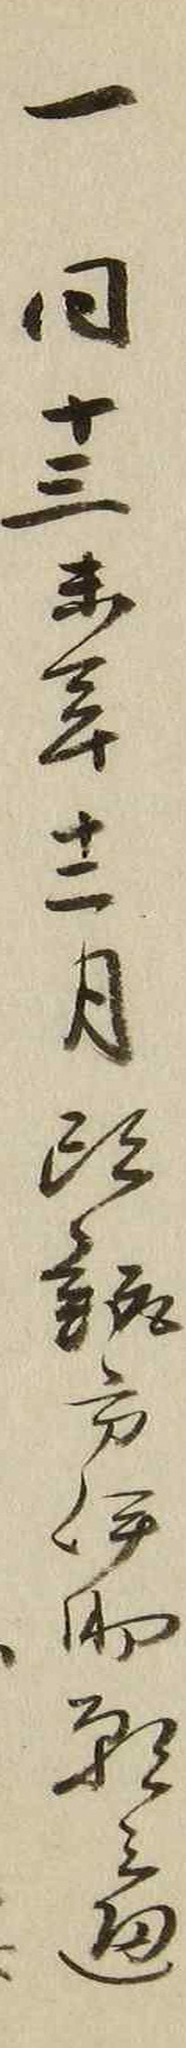一同十三未年十二月頭諏方伊助願之通
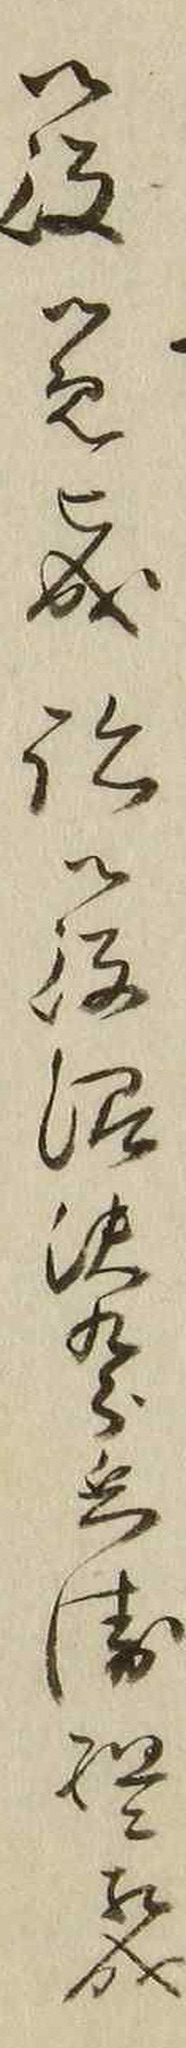御役御免被成跡御役沼沢九郎兵衛組ニ相成
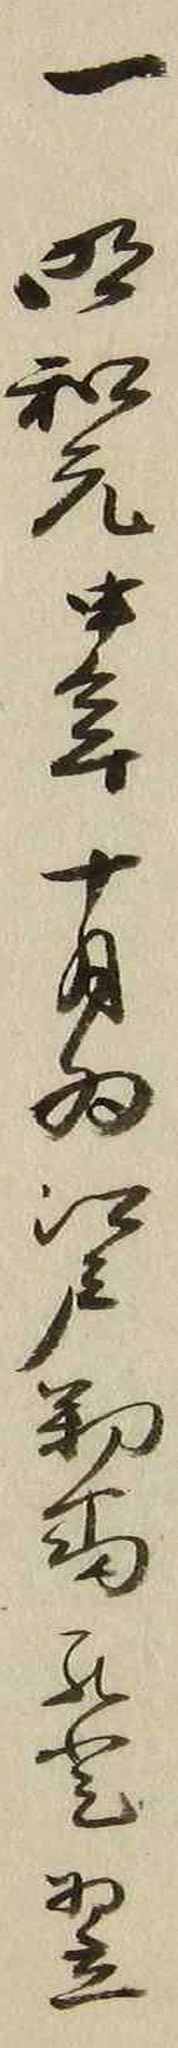一明和元申年十月為江戸勤番罷登翌
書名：諸士系譜　巻之311　し之部1
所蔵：会津若松市立会津図書館
